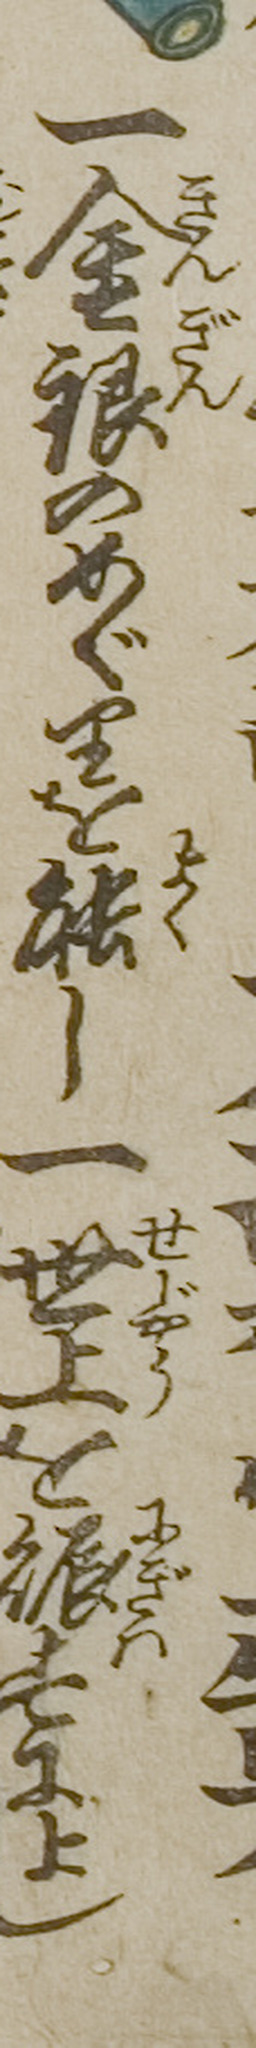一金銀のめぐりを能し一世上を賑すによし
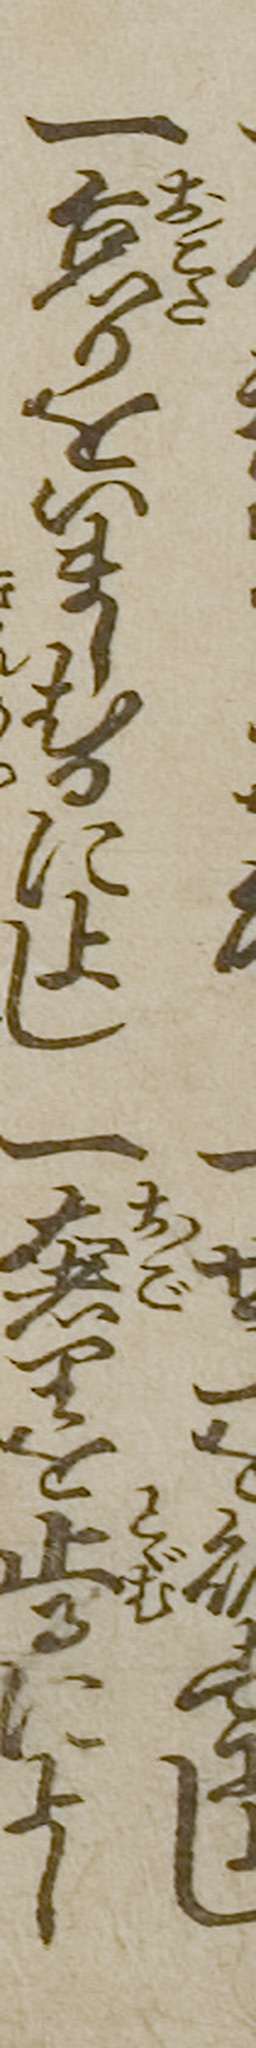一怠りをいましむるによし一奢りを止るによし
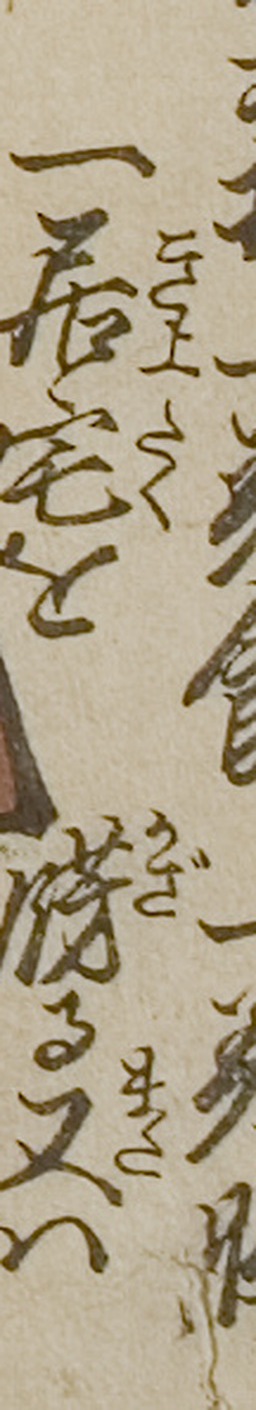一居宅を餝る又ハ
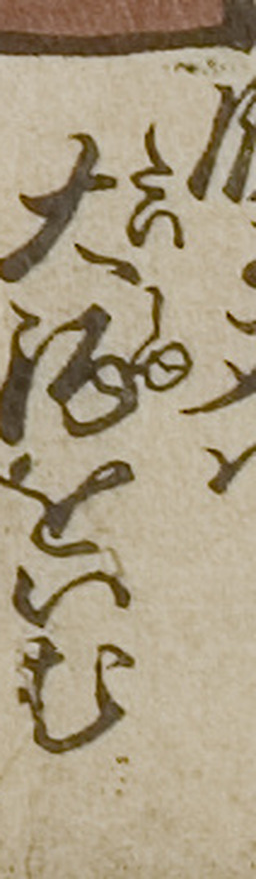大酒をいむ
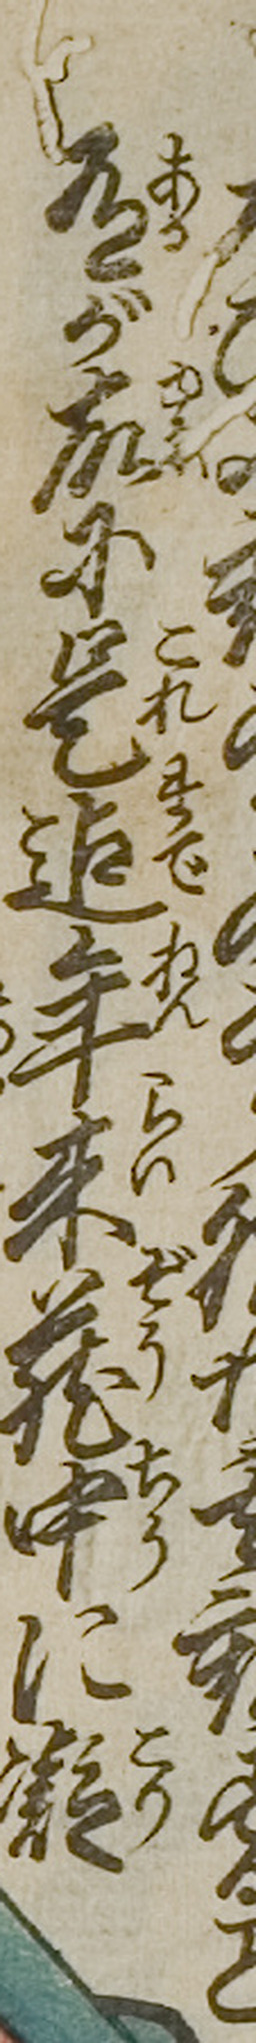有が故に是迄年来蔵中に凝
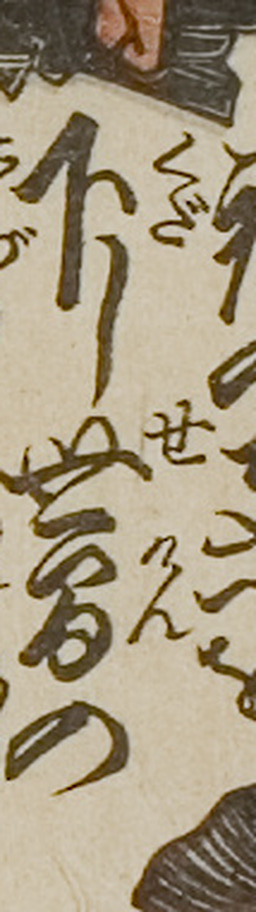下し世間の
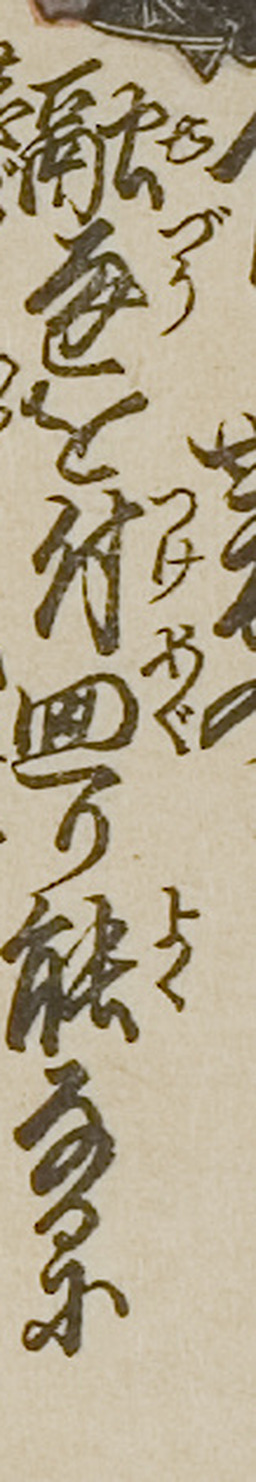融通を付廻り能なるに
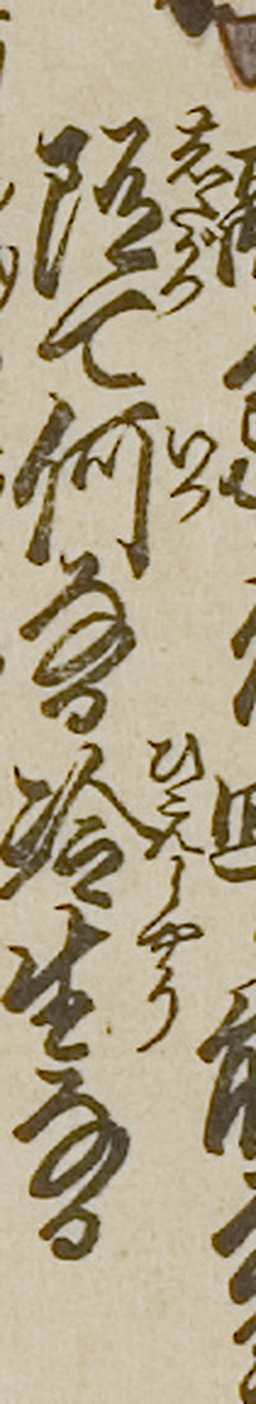随て何なる冷生なる
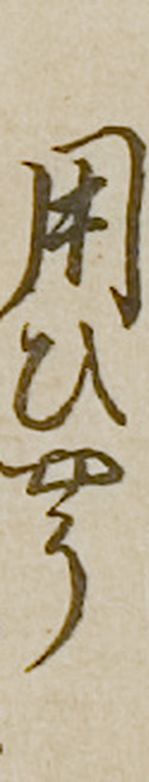用ひやう
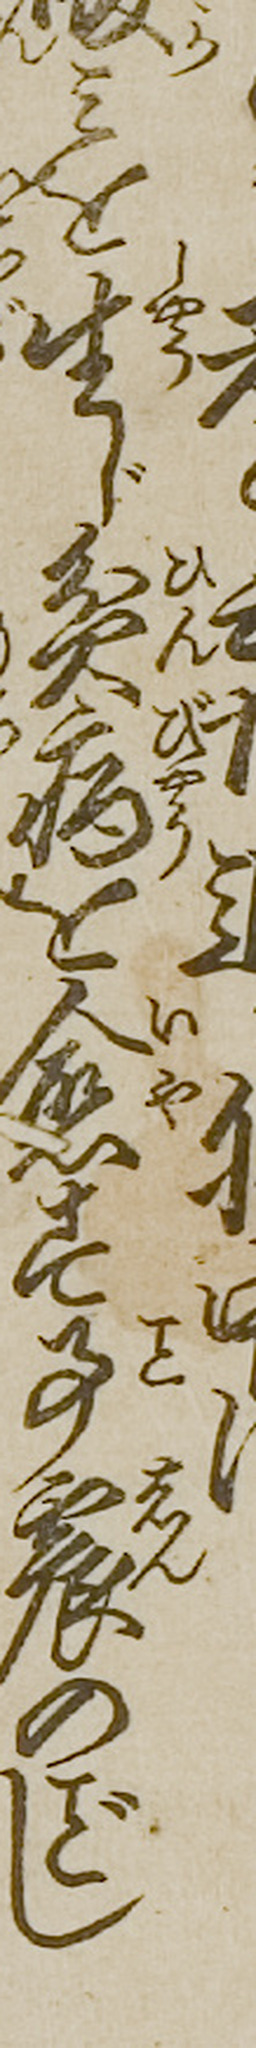暖ミを生じ貧病を愈す事震のごとし
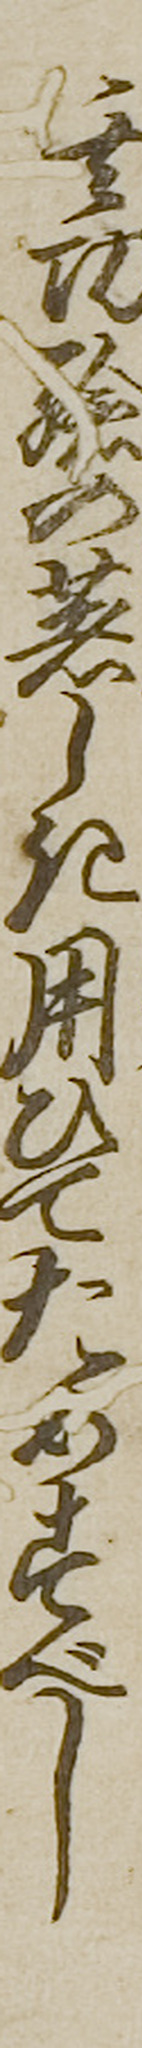其功験の著しき用ひてためすべし
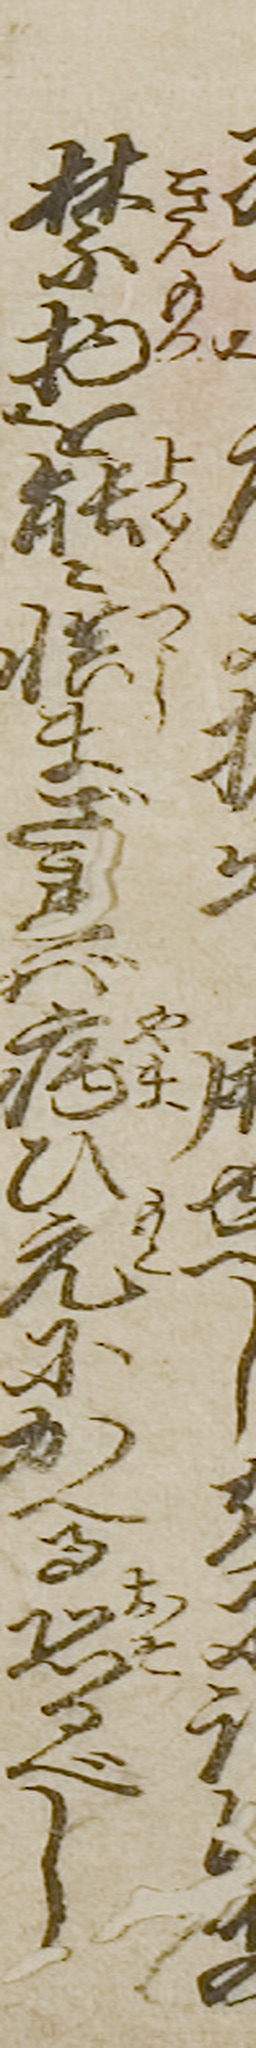禁物を能々慎まざれバ病ひ元にかへる恐るべし
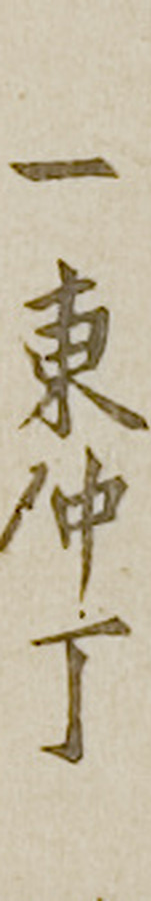一東仲丁
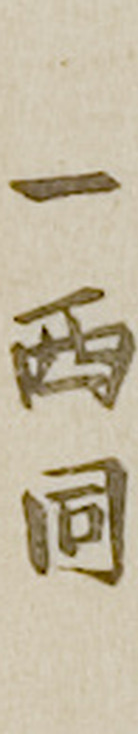一西同
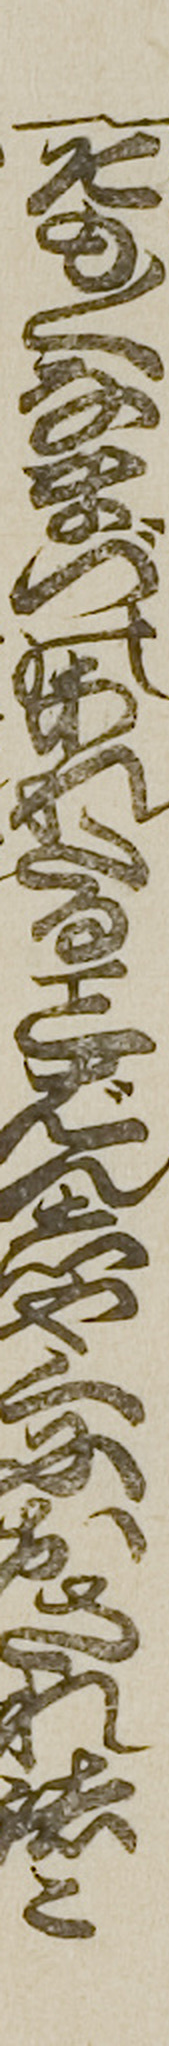「そも〳〵なまづのあれくることおばんしやくにおされ諸々
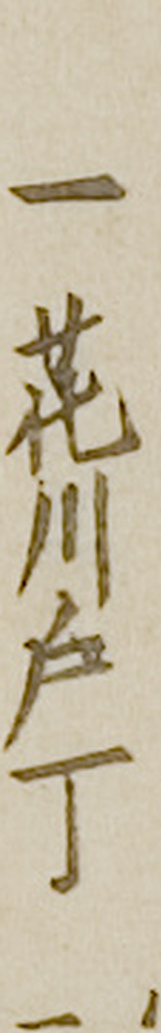一花川戸丁
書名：老まづ
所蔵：東京大学総合図書館 General Library in the University of Tokyo, JAPAN
